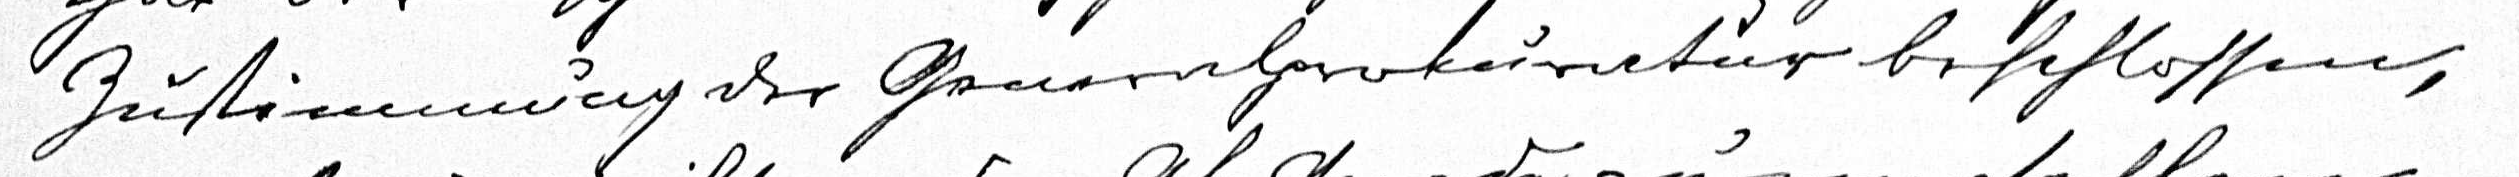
Zustimmung der Generalprokuratur beschlossen,
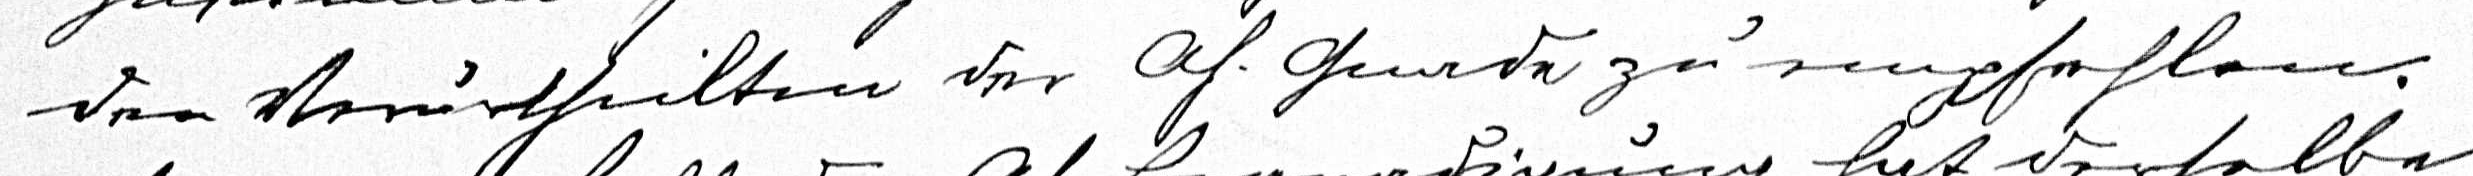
den Verurtheilten der ah. Gnade zu empfehlen.
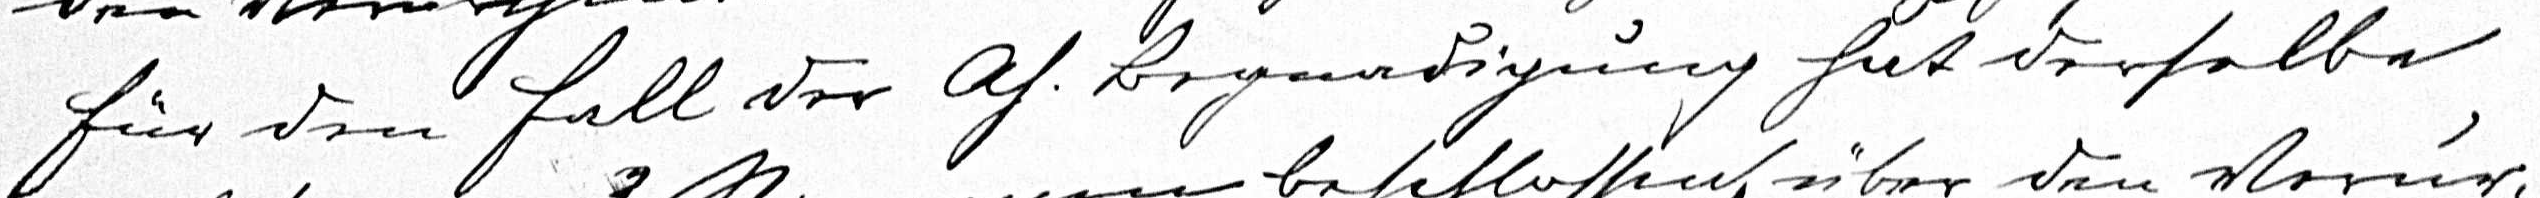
Für den Fall der Ah. Begnadigung hat derselbe
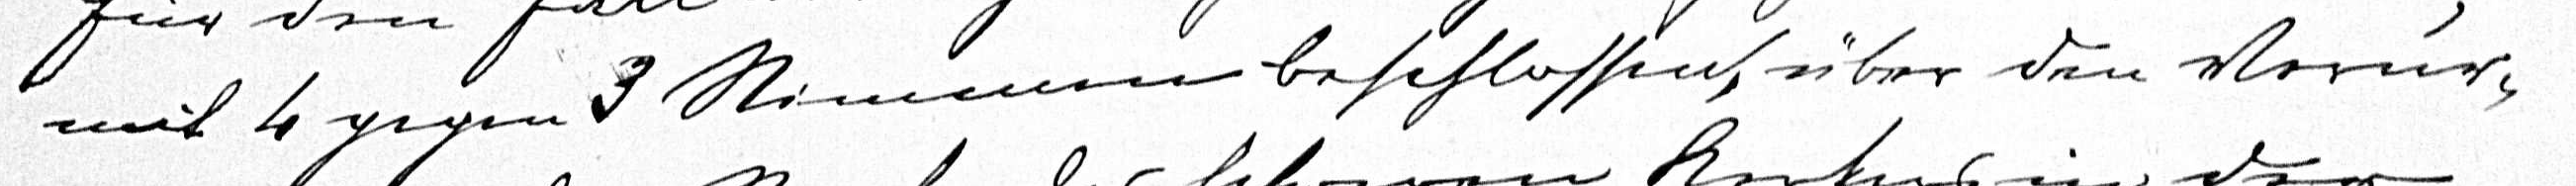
mit 4 gegen 3 Stimmen beschlossen, über den Verur¬
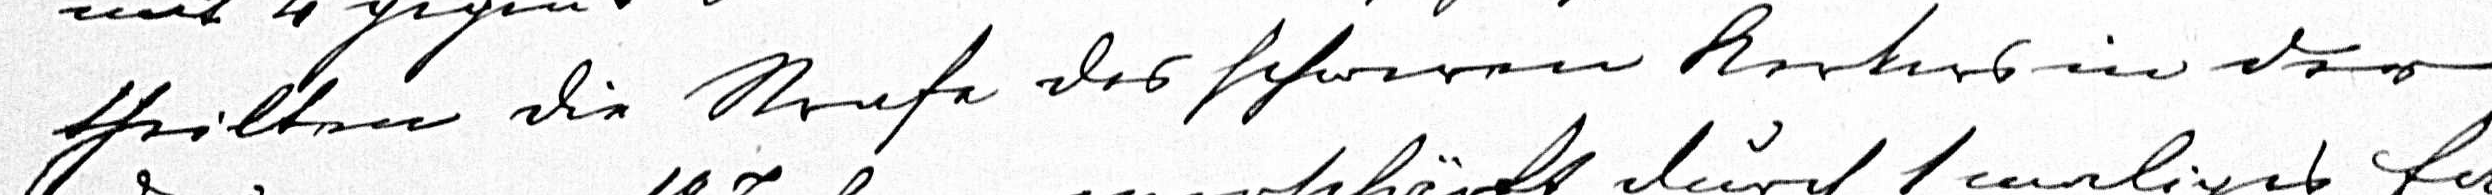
theilten die Strafe des schweren Kerkers in der
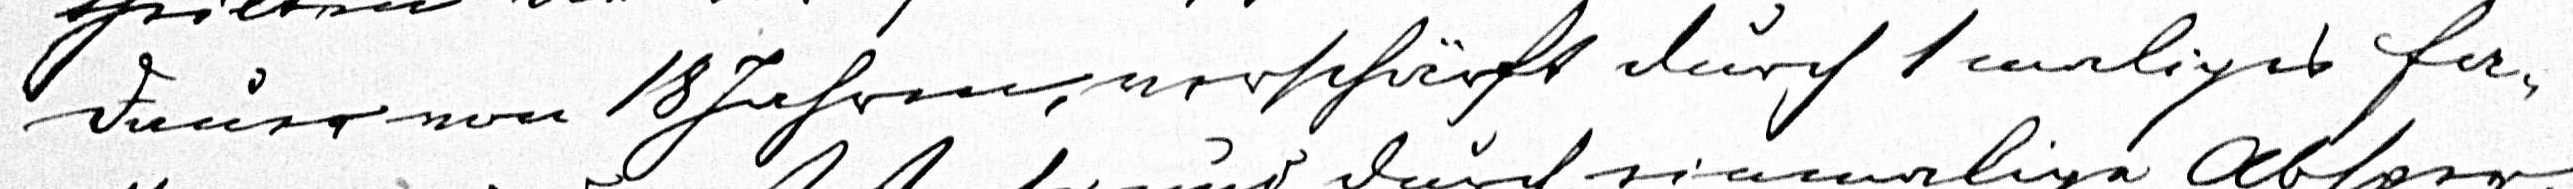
Dauer vom 18 Jahren verschärft durch 1 maliges Fa¬
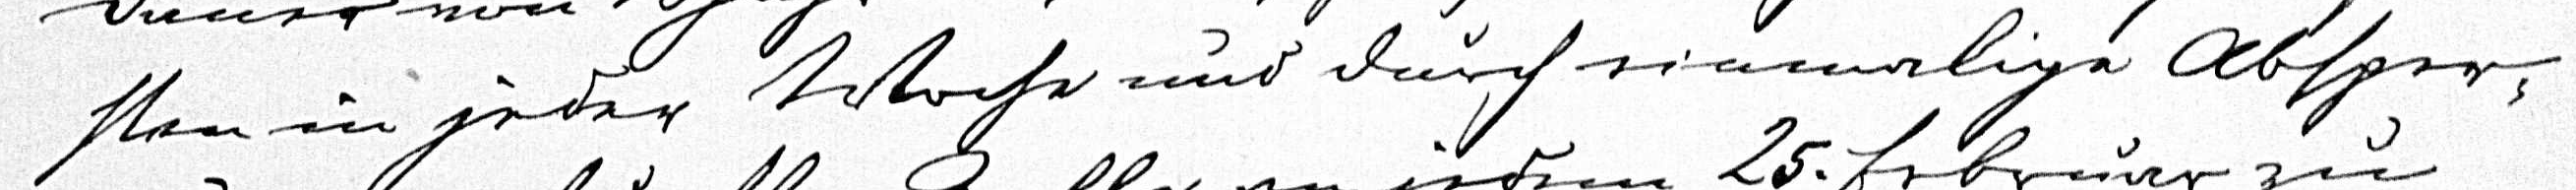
sten in jeder Woche und durch einmalige Absper¬
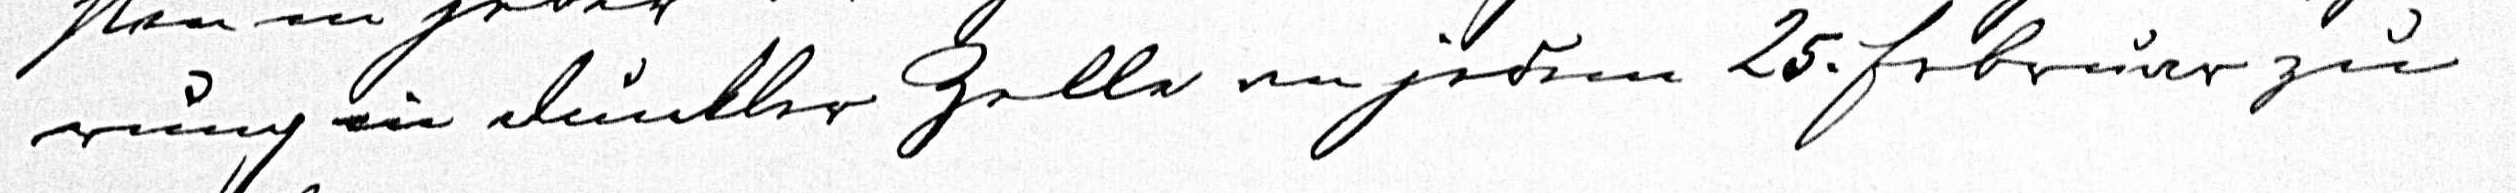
rung in dunkler Zelle an jedem 25. Februar zu
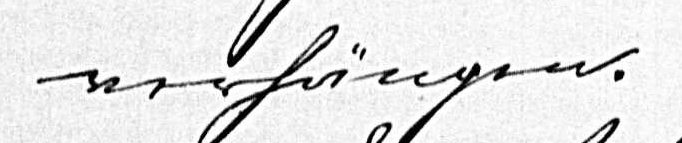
verhängen.
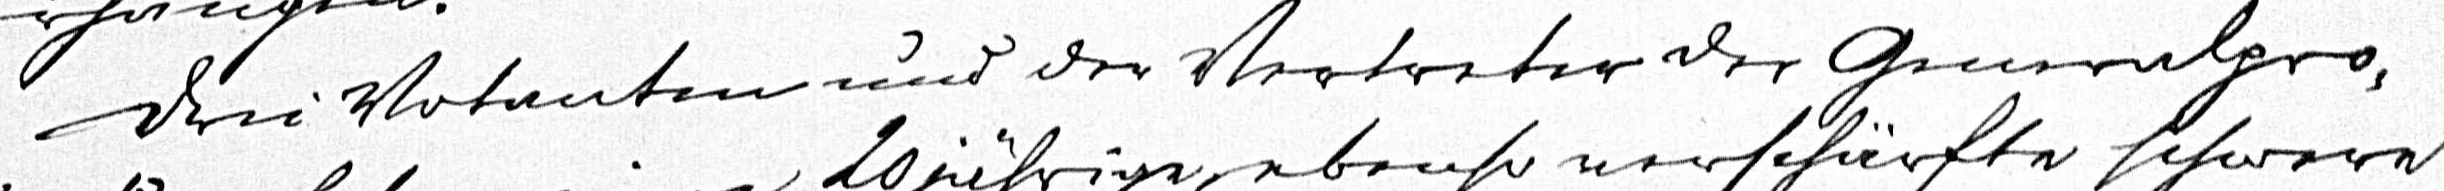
Drei Votanten und der Vertreter der Generalpro¬
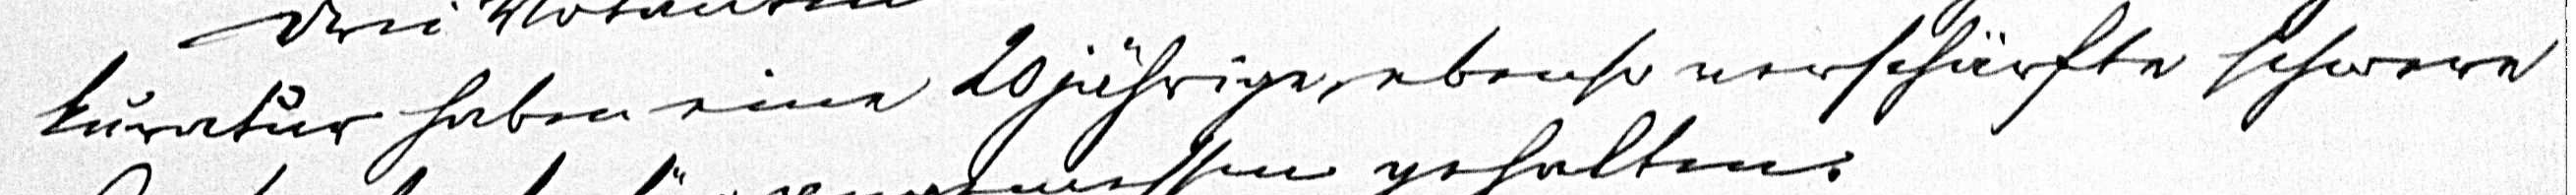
kuratur haben eine 20jährigen ebenso verschärfte schwere
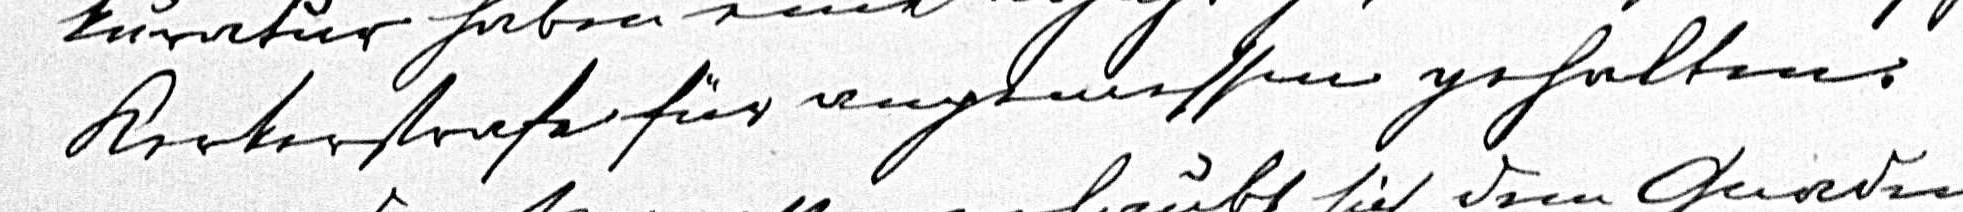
Kerkerstrafe für angemessen gehalten.
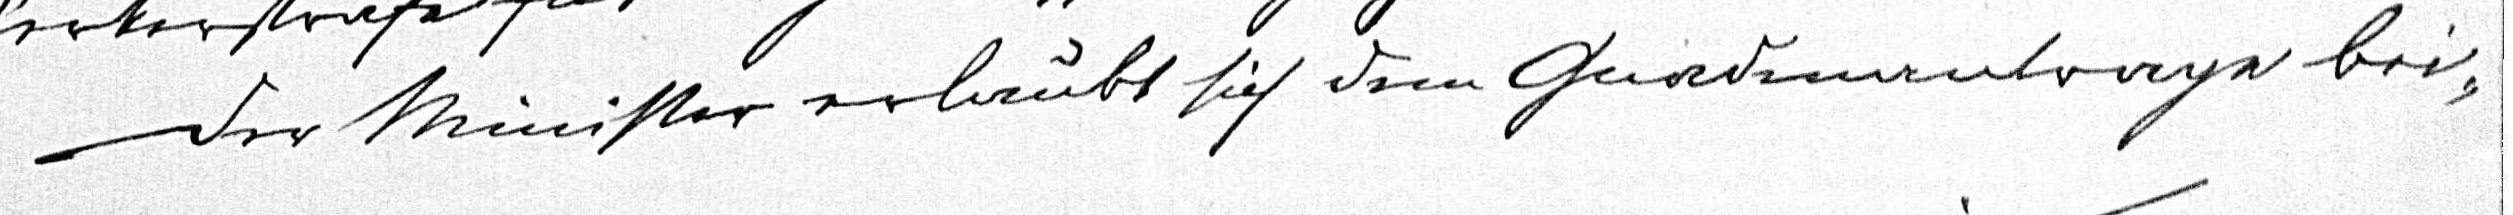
Der Minister erlaubt sich dem Gnadenantrage bei¬
